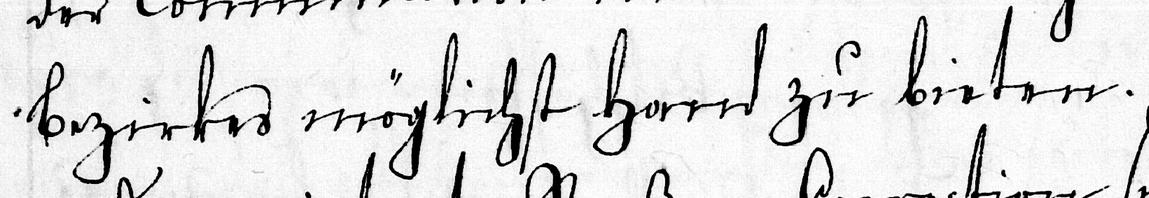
Bezirkes möglichst Hand zu bieten.
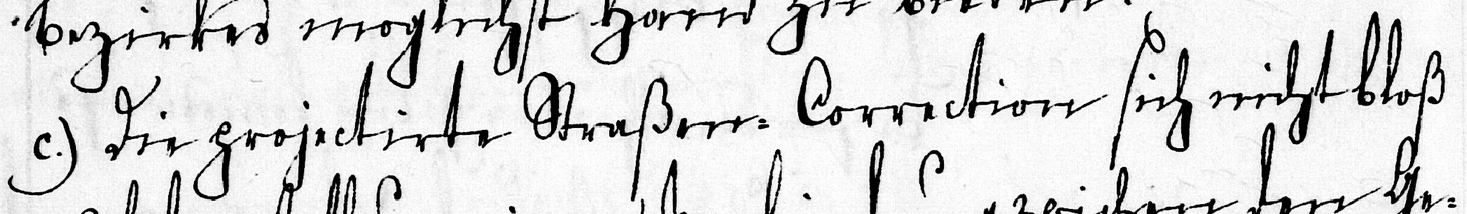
c.) Die projectirte Straßen-Correction sich nicht bloß
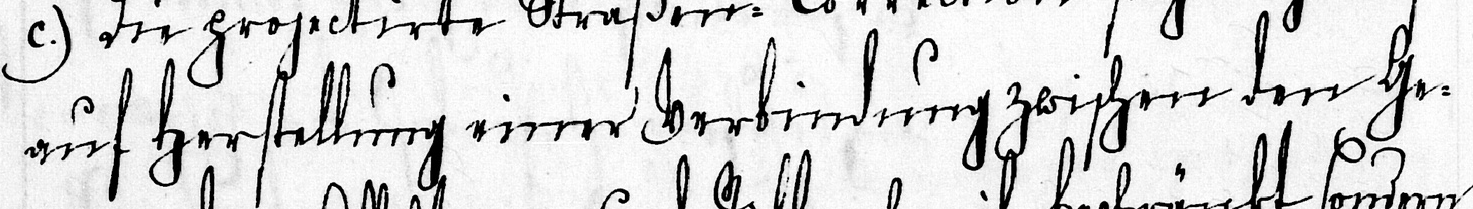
auf Herstellung einer Verbindung zwischen den Ge¬
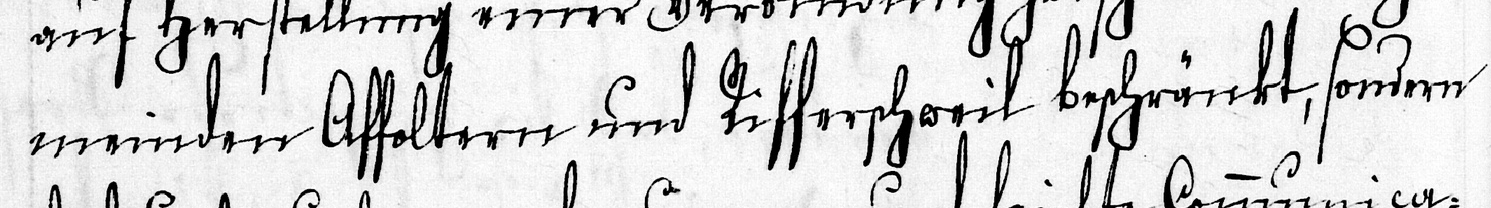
meinden Affoltern und Rifferschweil beschränkt, sondern
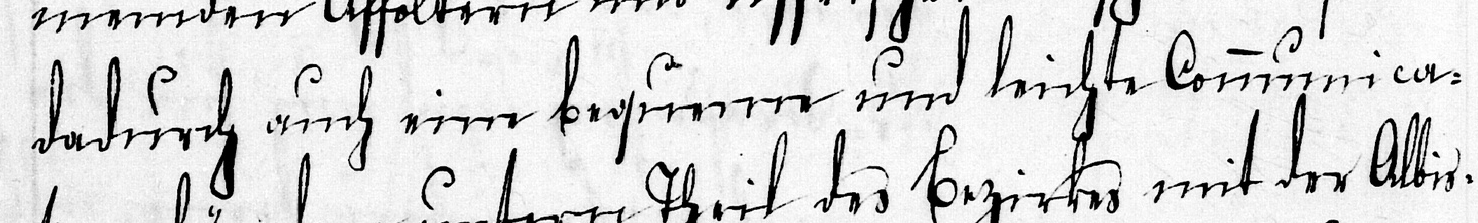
dadurch auch eine bequeme und leichte Communica¬
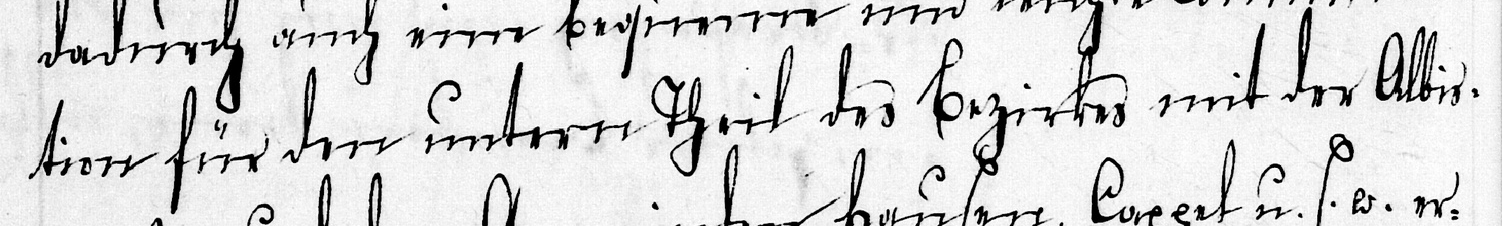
tion für den untern Theil des Bezirkes mit der Albis¬
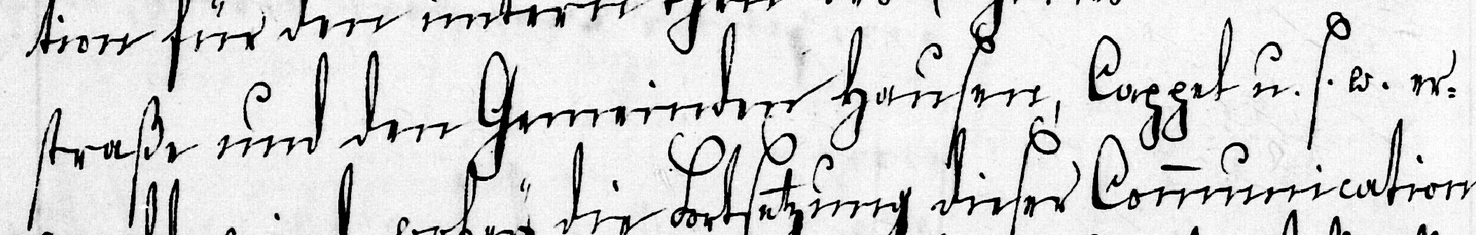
straße und den Gemeinden Hausen, Cappel u. s. w.
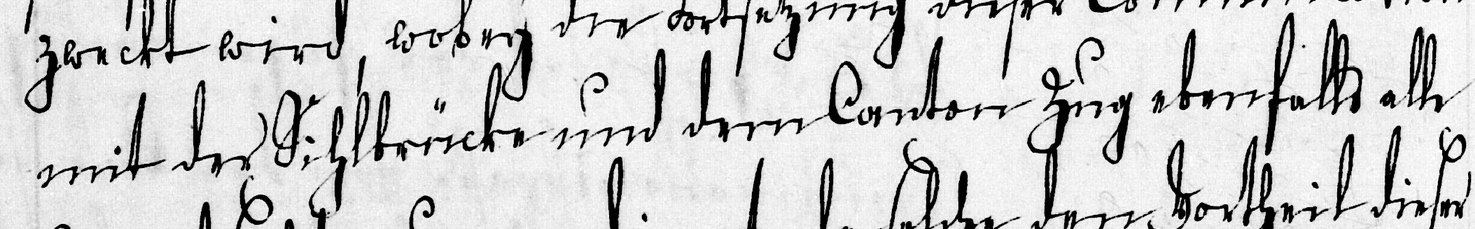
mit der Sihlbrücke und dem Canton Zug ebenfalls
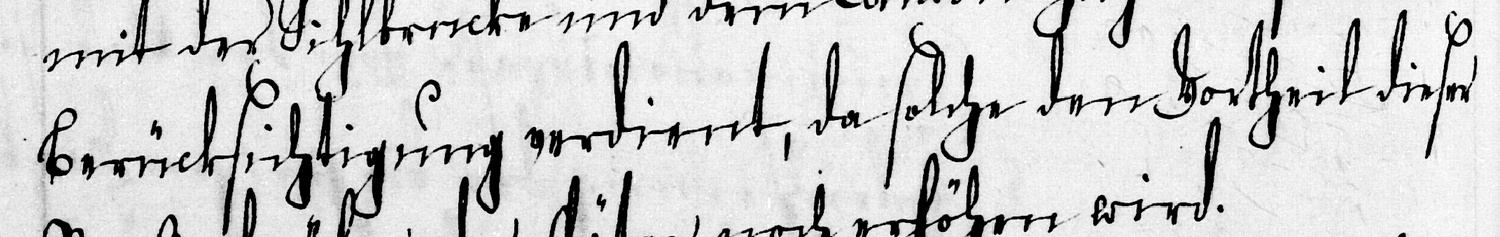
Berücksichtigung verdient, da solche den Vortheil dies¬
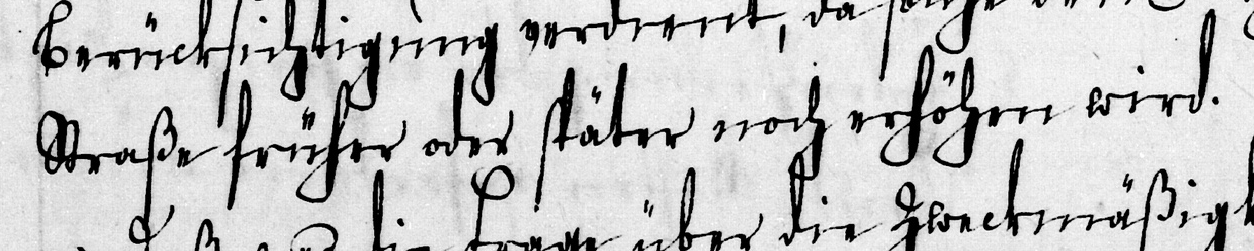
Straße früher oder später noch erhöhen wird.
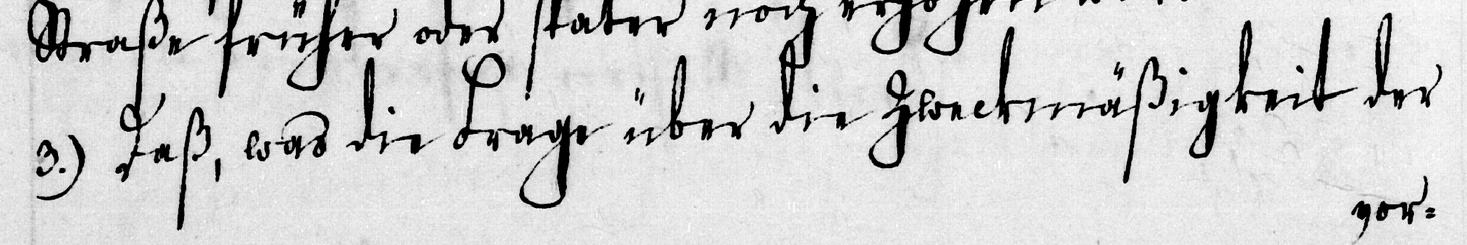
3.) Daß, was die Frage über die Zweckmäßigkeit der
